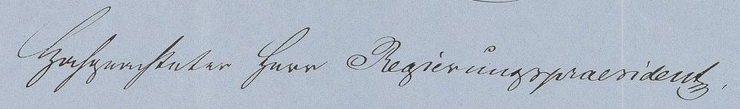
Hochgeachteter Herr Regierungspraesident.
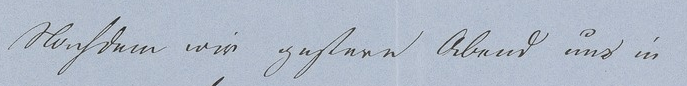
Nachdem wir gestern Abend uns in
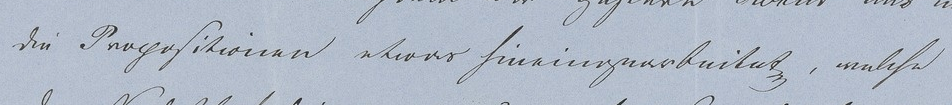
die Propositionen etwas hineingearbeitet, welche
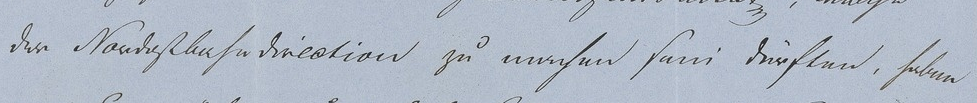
der Nordostbahndirection zu machen sein dürften, haben
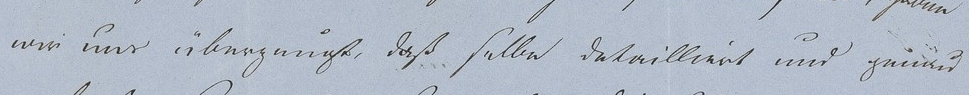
wir uns überzeugt, daß selbe detailliert und genau
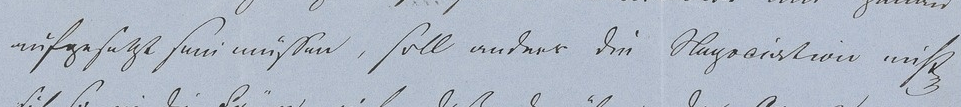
aufgesetzt sein müssen, soll anders die Negociation nicht
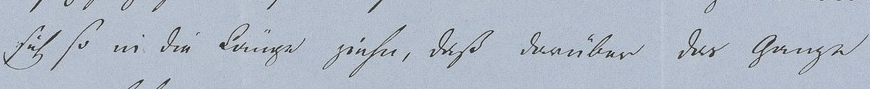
sich so in die Länge ziehn, daß darüber das Ganze
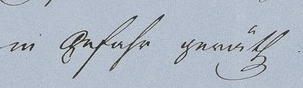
in Gefahr geräth.
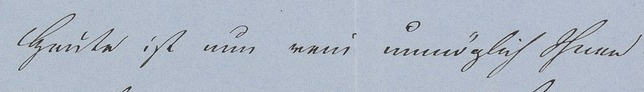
Heute ist nun rein unmöglich Ihnen
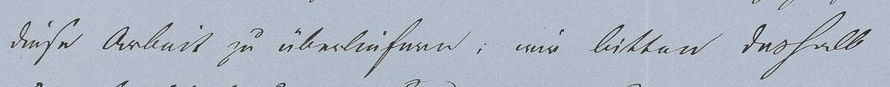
diese Arbeit zu überliefern; wir bitten deshalb
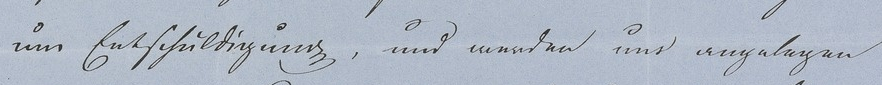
um Entschuldigung, und werden uns angelegen
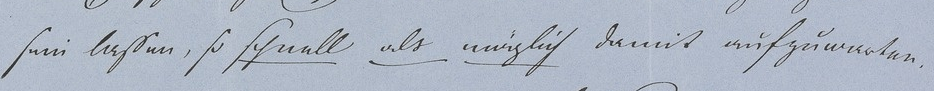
sein lassen, so schnellalsmöglich damit aufzuwarten.
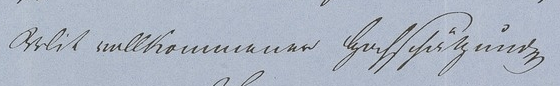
Mit vollkommener Hochschätzung
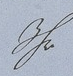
Ihr
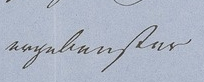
ergebenster
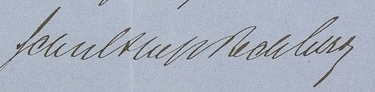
Schulthess Rechberg
